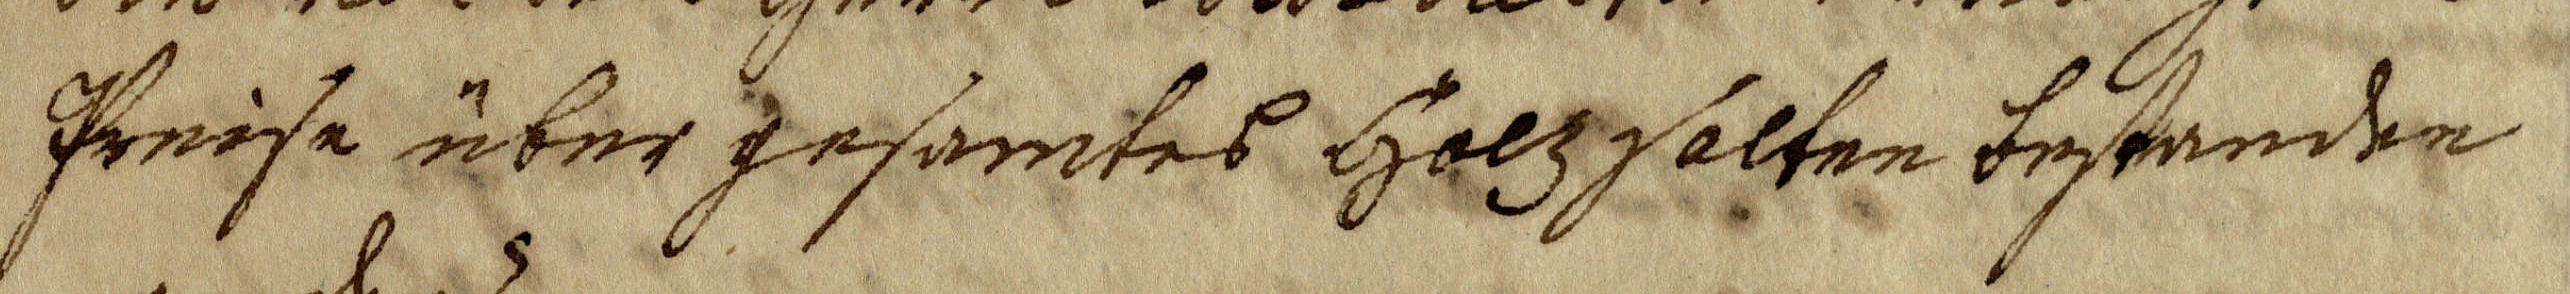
Preise über gesamtes Holz solten bestanden
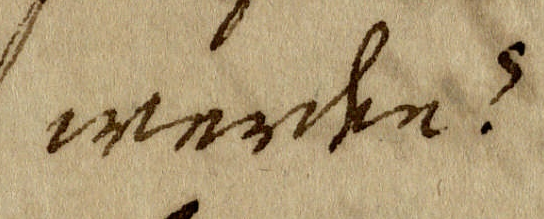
werden?
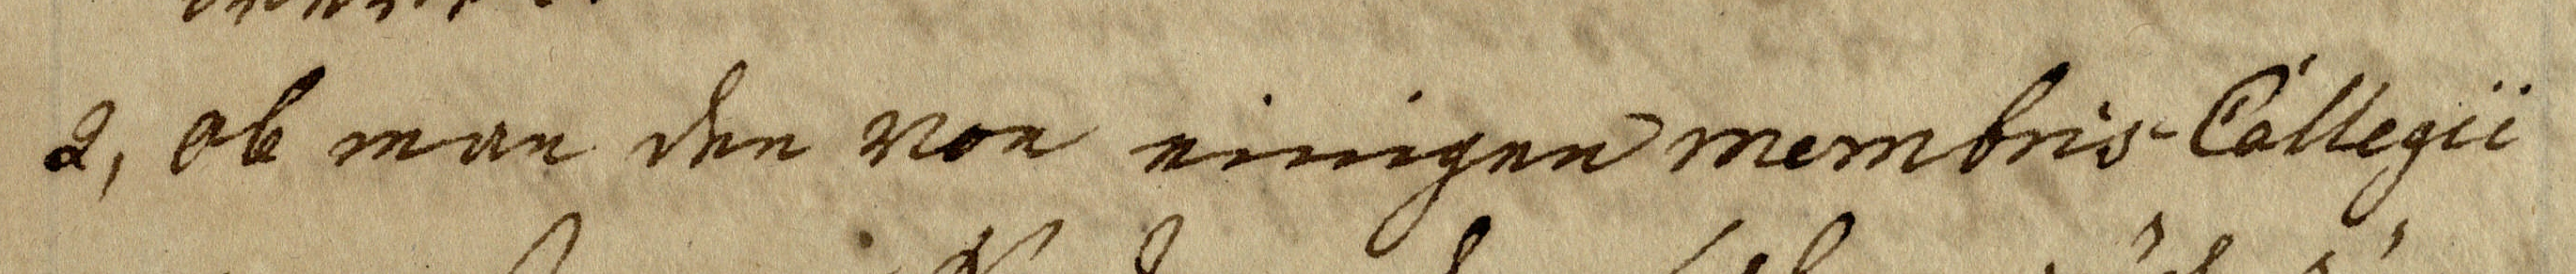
2, ob man den von einigen membris Collegii
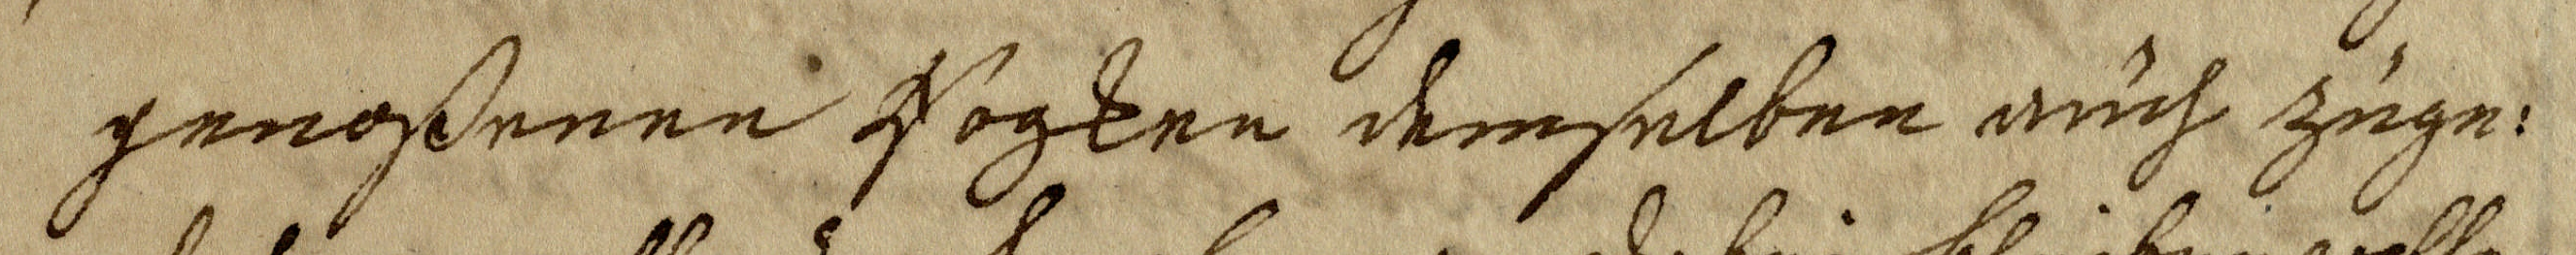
genoßenen Rogken demselben auch zuge¬
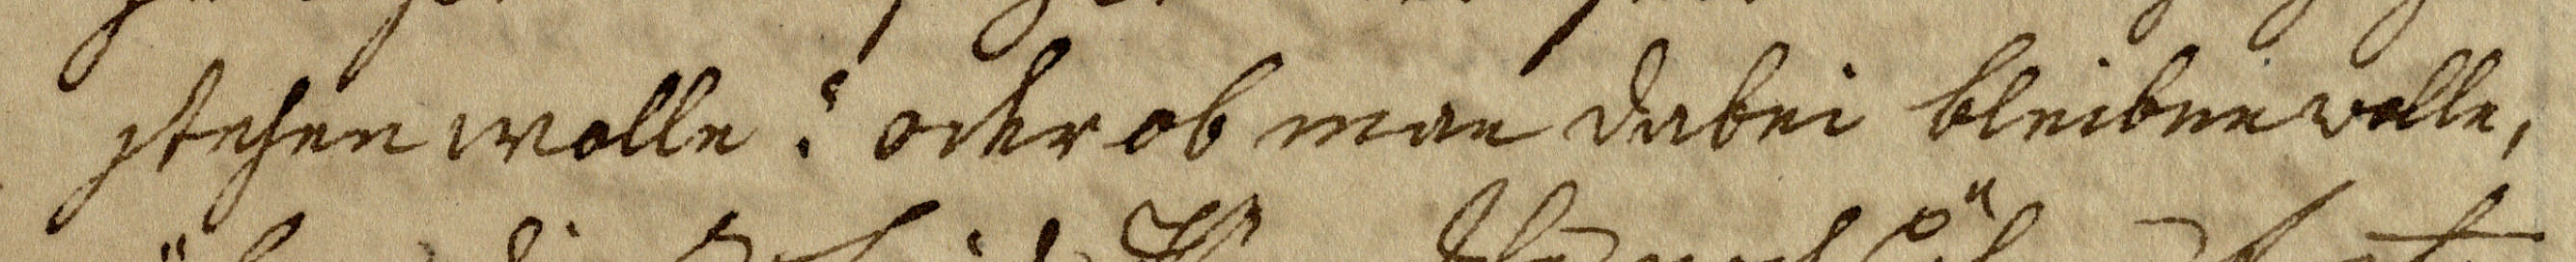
stehen wolle? oder ob man dabei bleiben wolle,
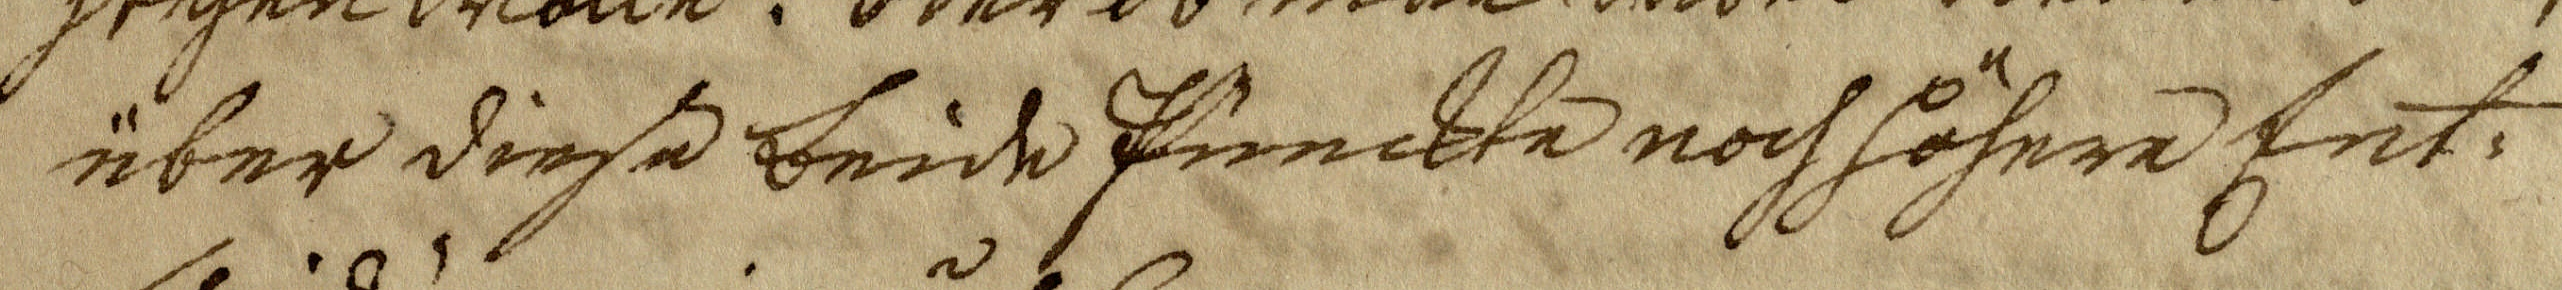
über diese beide Punkte noch höhere Ent¬
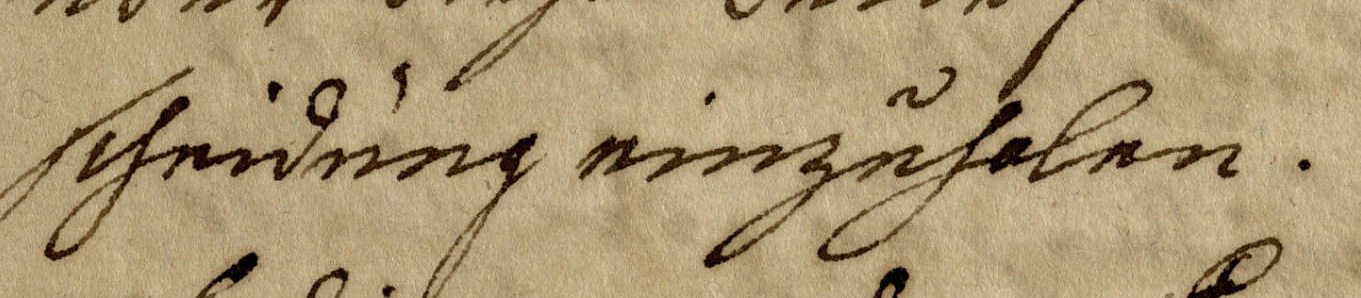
scheidung einzuholen.
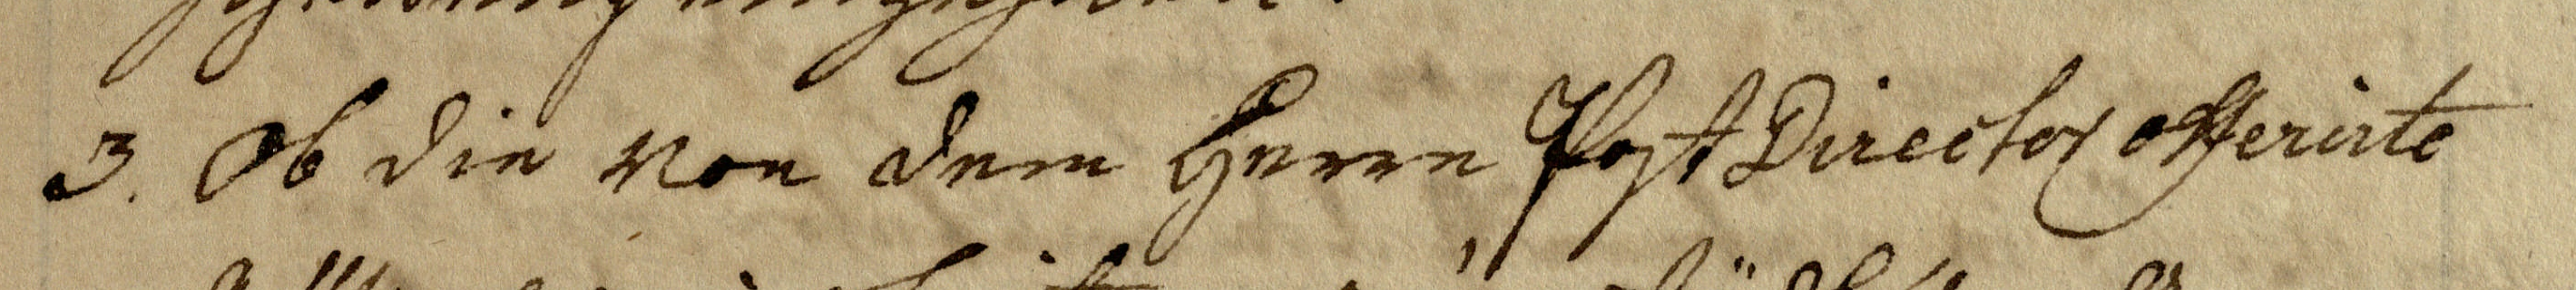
3. ob die von dem Herrn Post Director offerirte
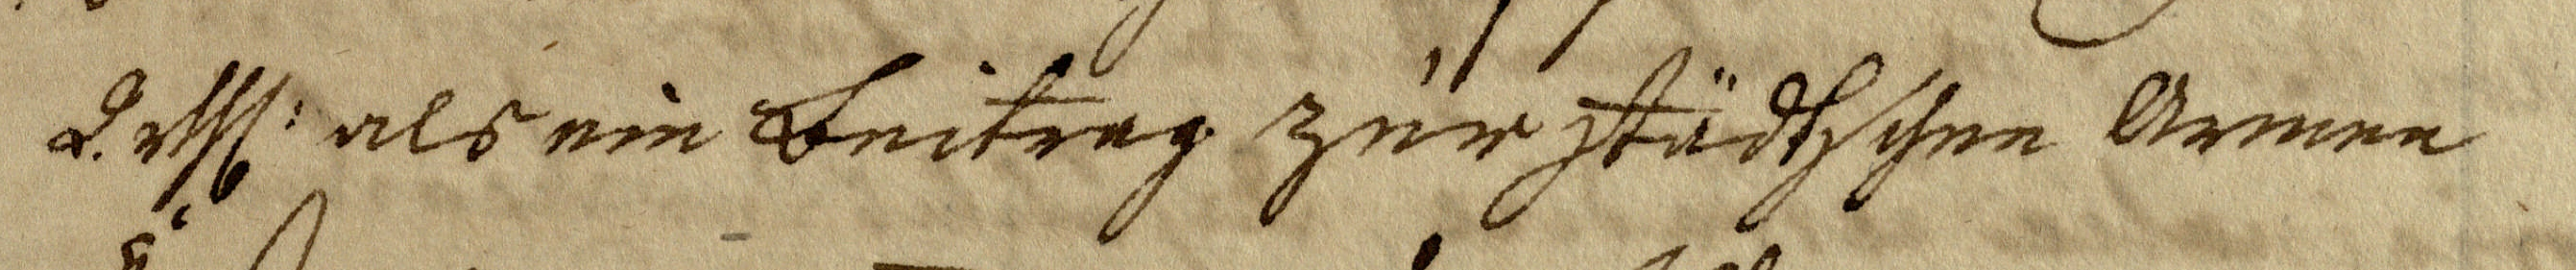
2. rth. als ein Beitrag zur städtschen Armen
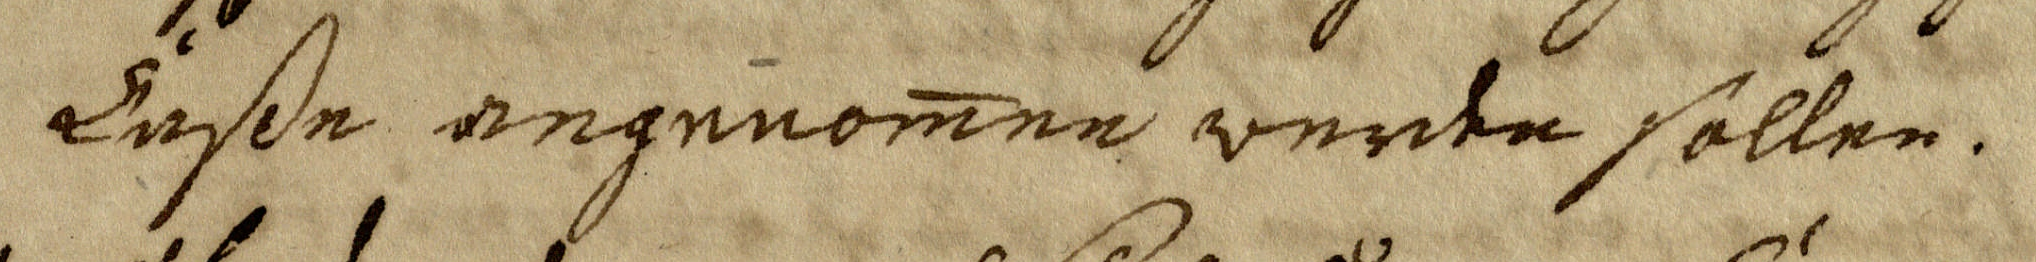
Caße angenomen werden sollen.
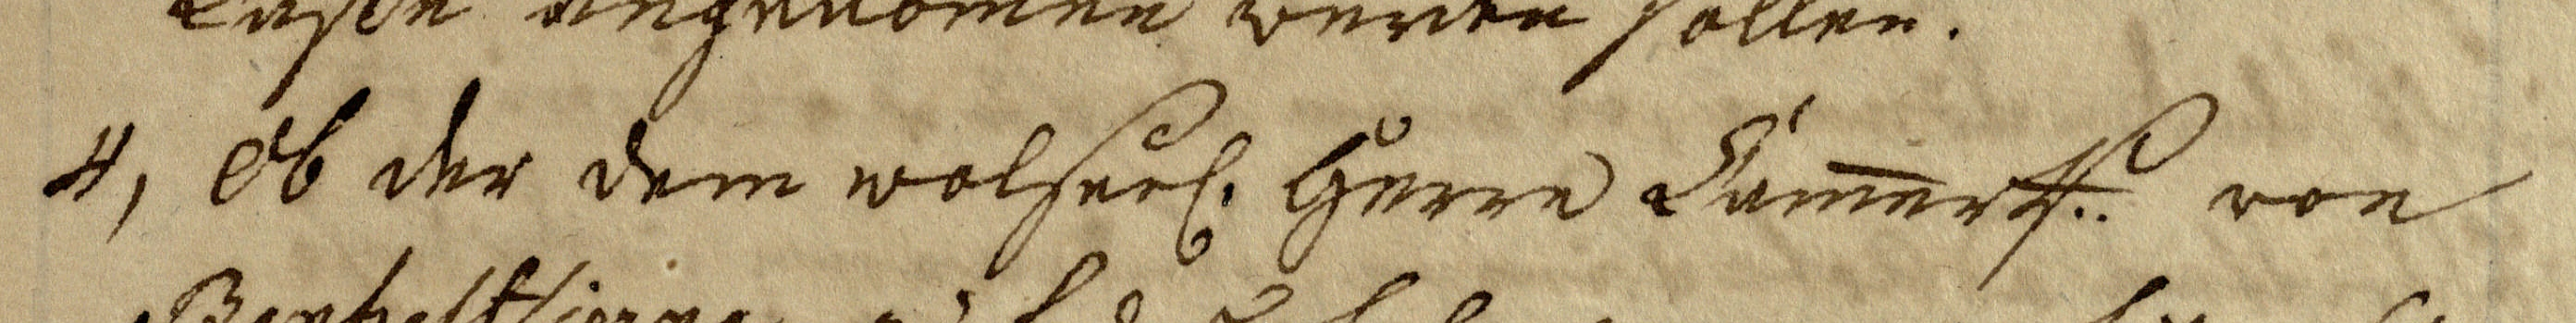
4, ob der dem wolseel Herrn CamerR. von
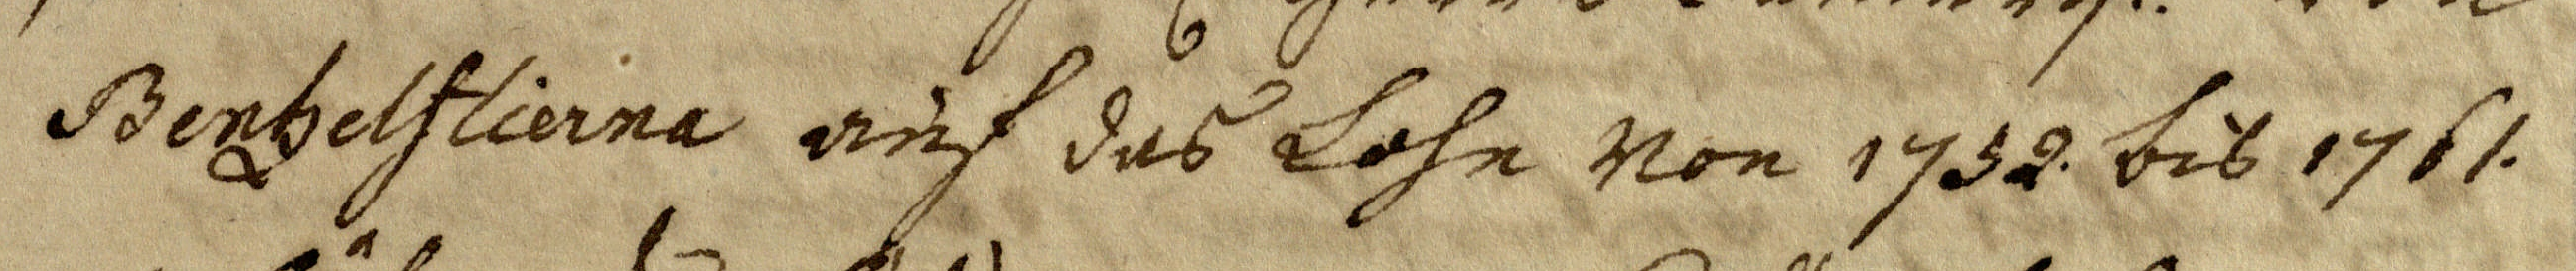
Bentzelstierna auf das Lohn von 1752 bis 1761.
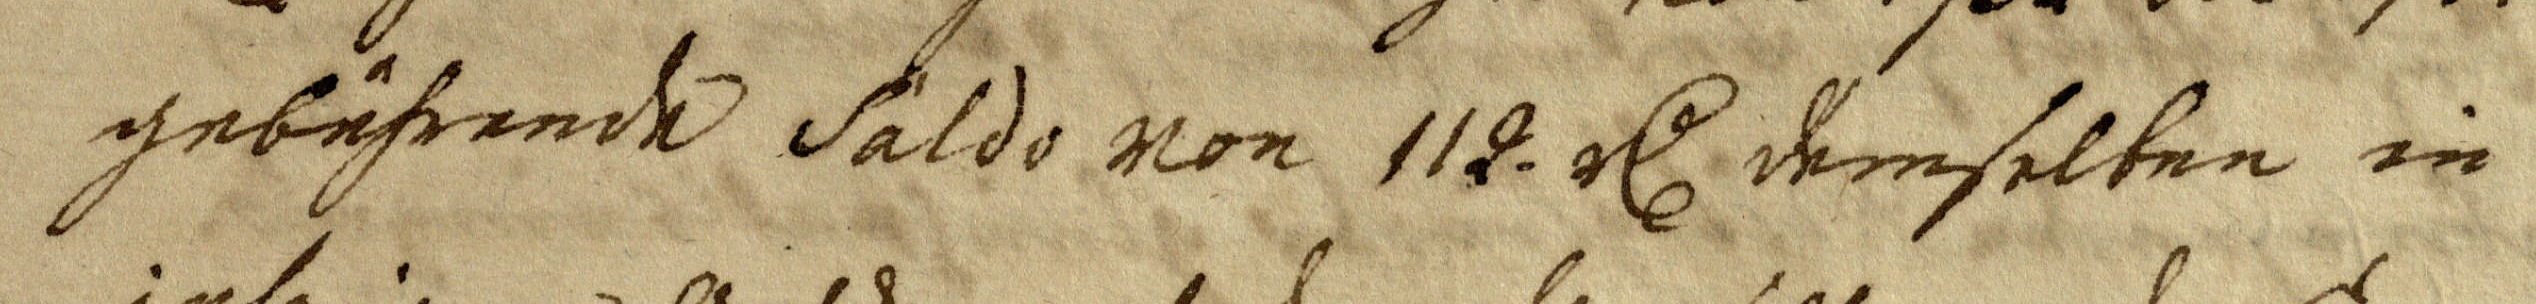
gebührende Saldo von 112. rtl. demselben in
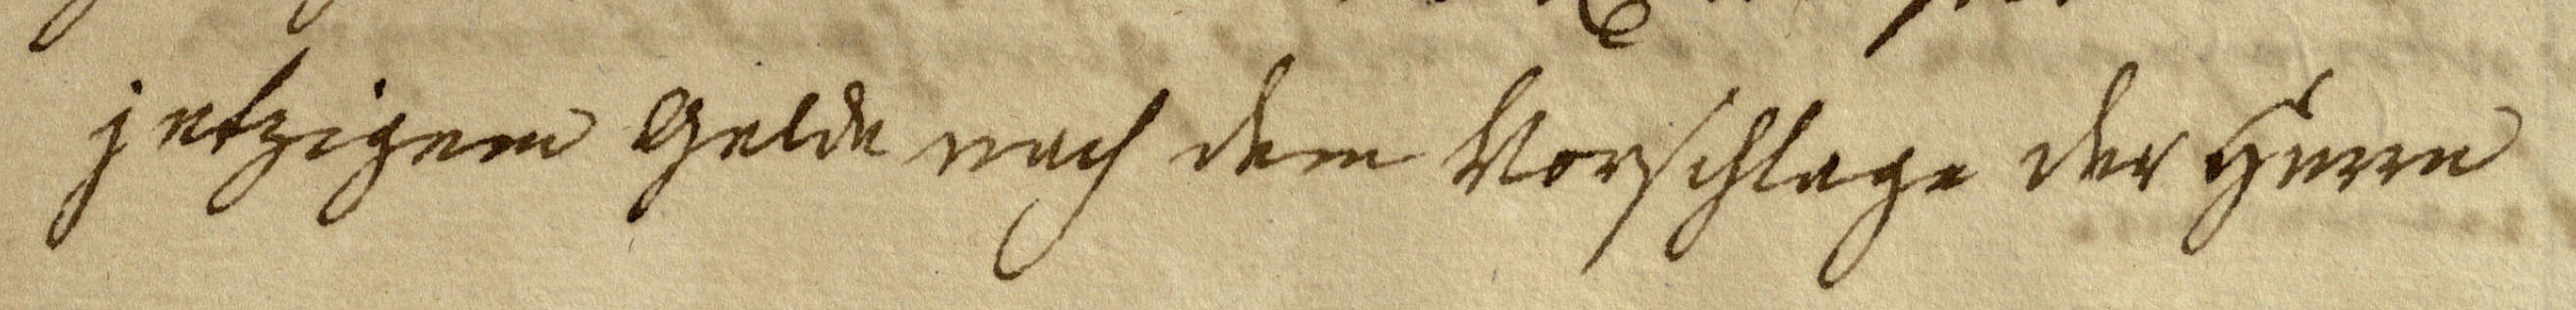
jetzigem Gelde nach dem Vorschlage der Herrn
